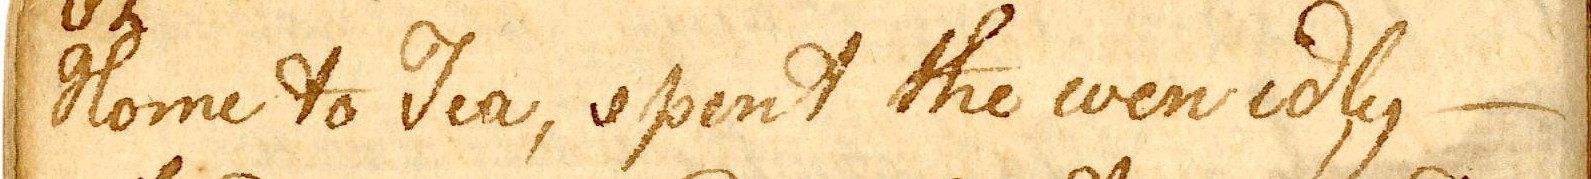Home to Tea, spent the even idly-
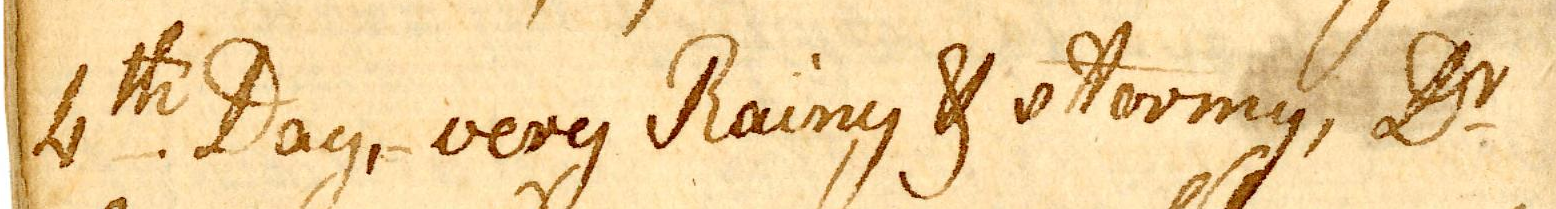4^th Day, very Rainy & stormy, D^r
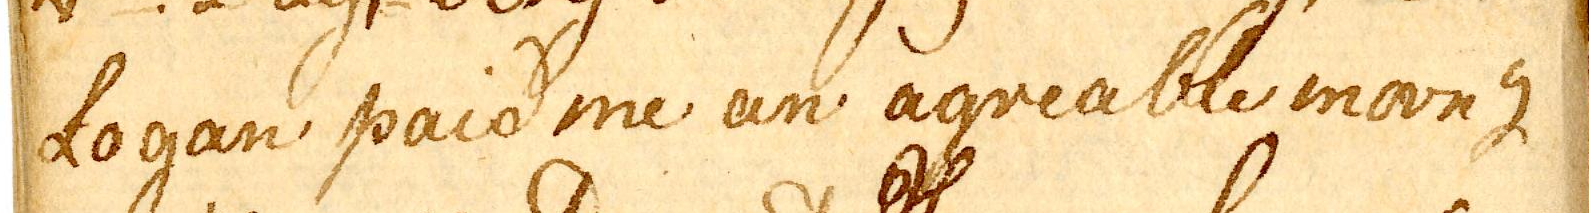Logan paid me an agreable morn^g
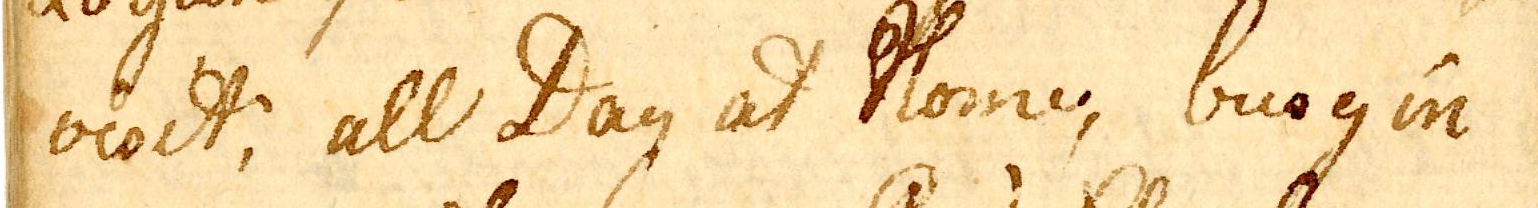visit, all Day at Home, busy in
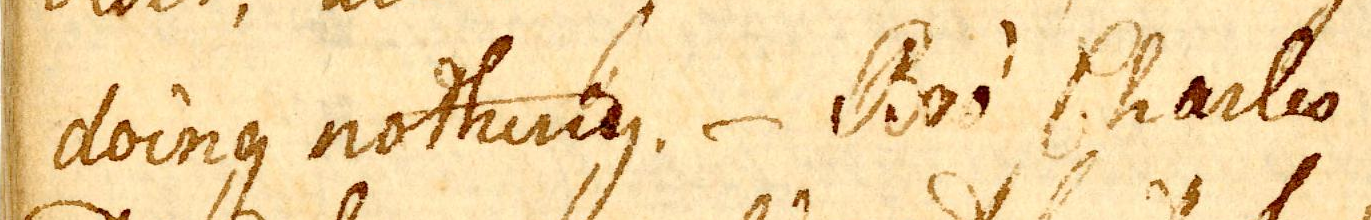doing nothing,- Bro' Charles
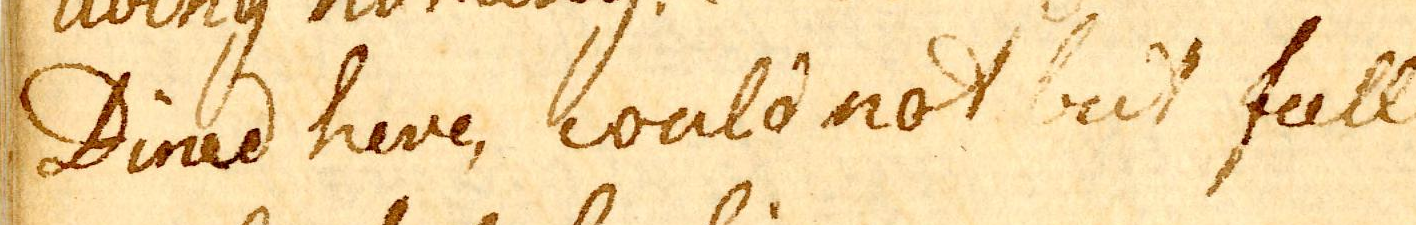Dined here, could not but feell
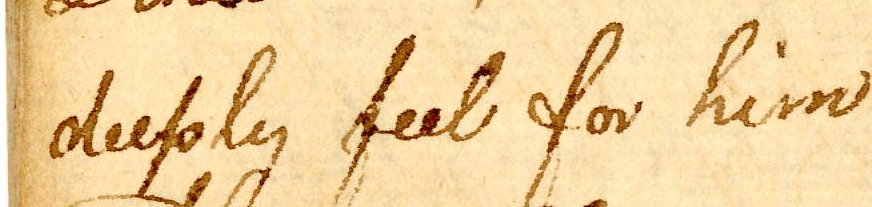deeply feel for him
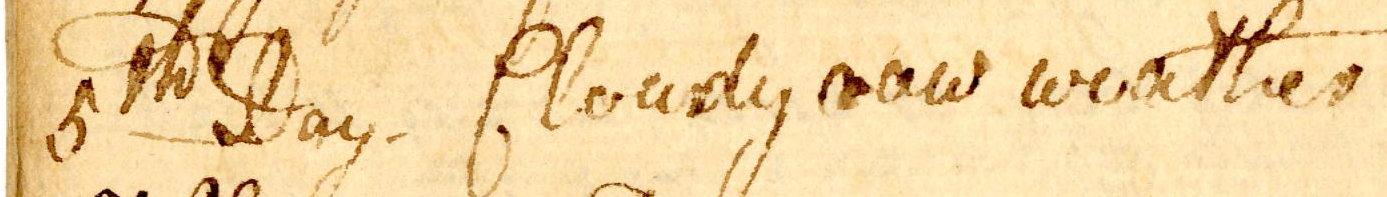5^th Day- Cloudy raw weather
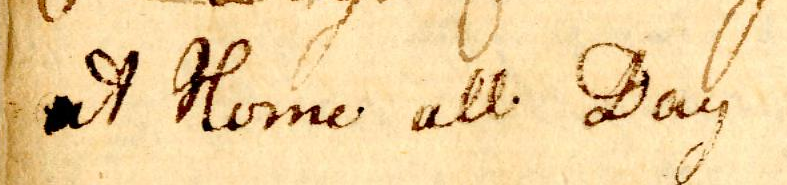at Home all Day
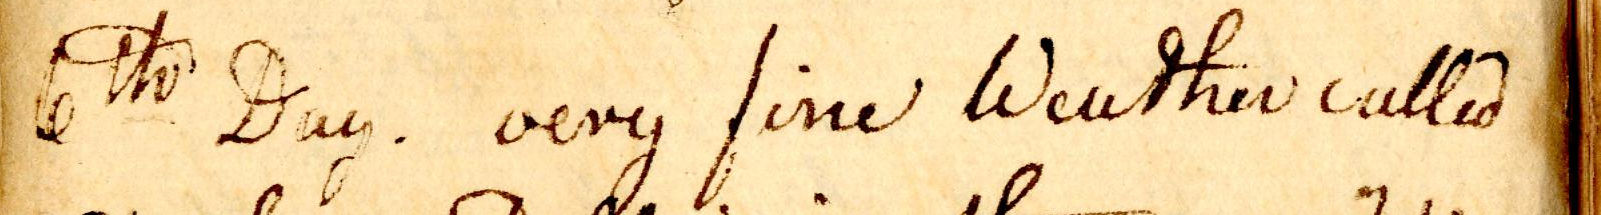6^th Day. very fine Weather called
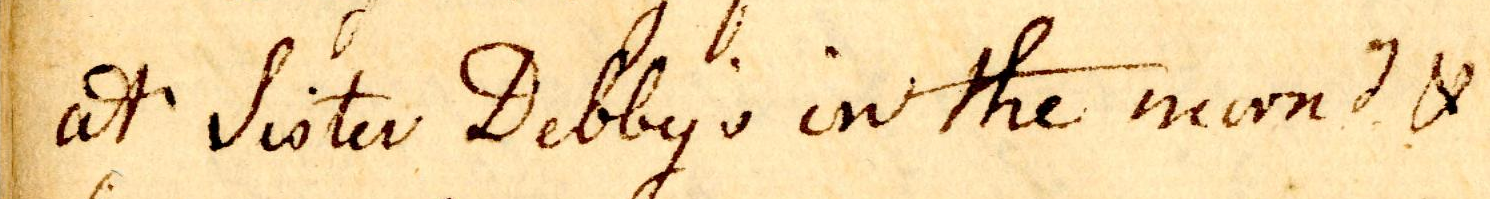at Sister Debby's in the morn^g &
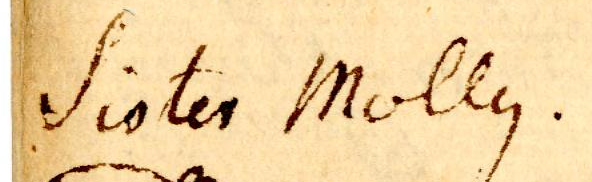Sister Molly.
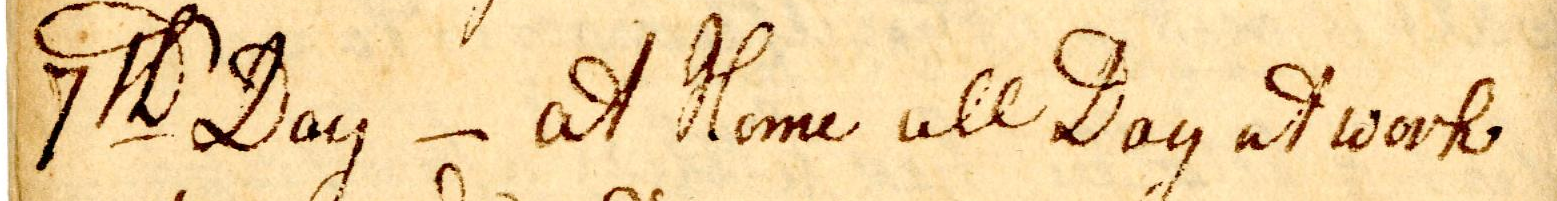7^th Day- at Home all Day at work
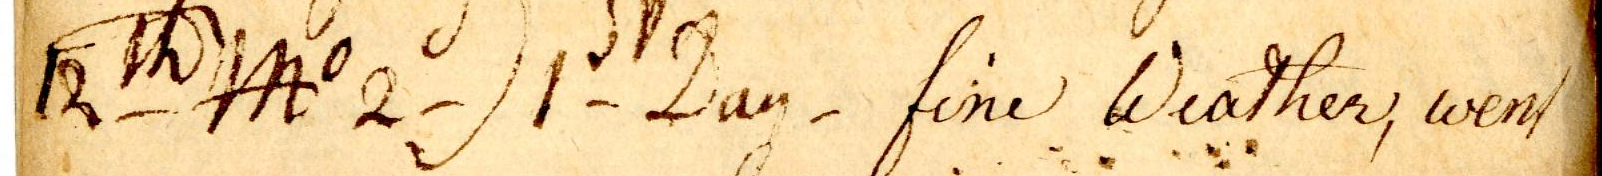12^th M^o 2^d) 1^st Day- fine Weather, went
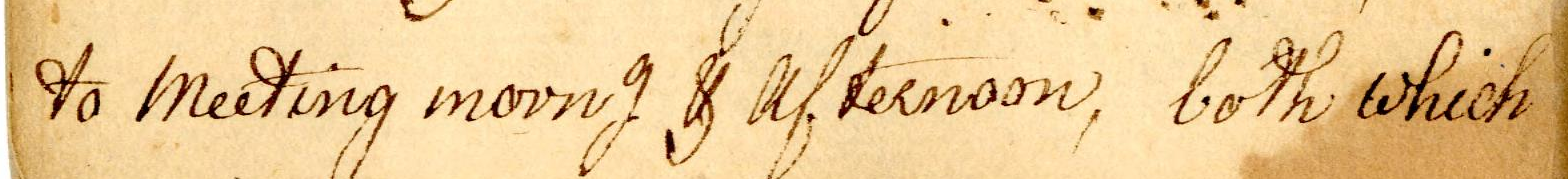to Meeting morn^g & Afternoon, both which
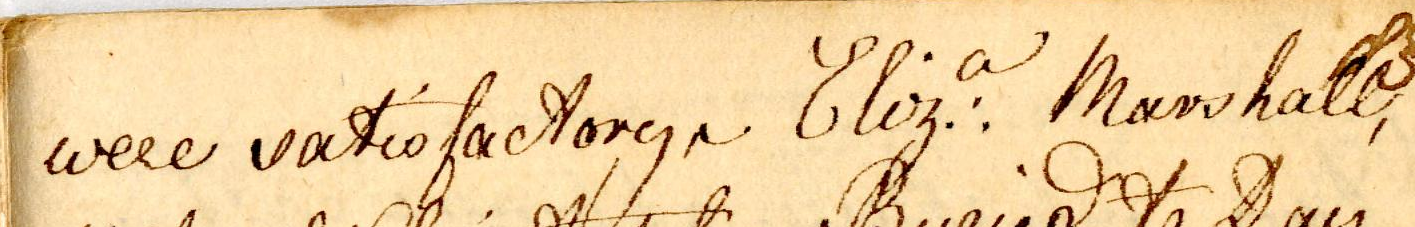were satisfactory a Eliz^a: Marshall
